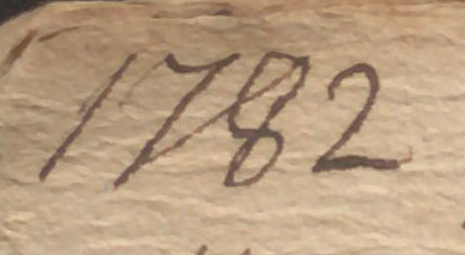1782
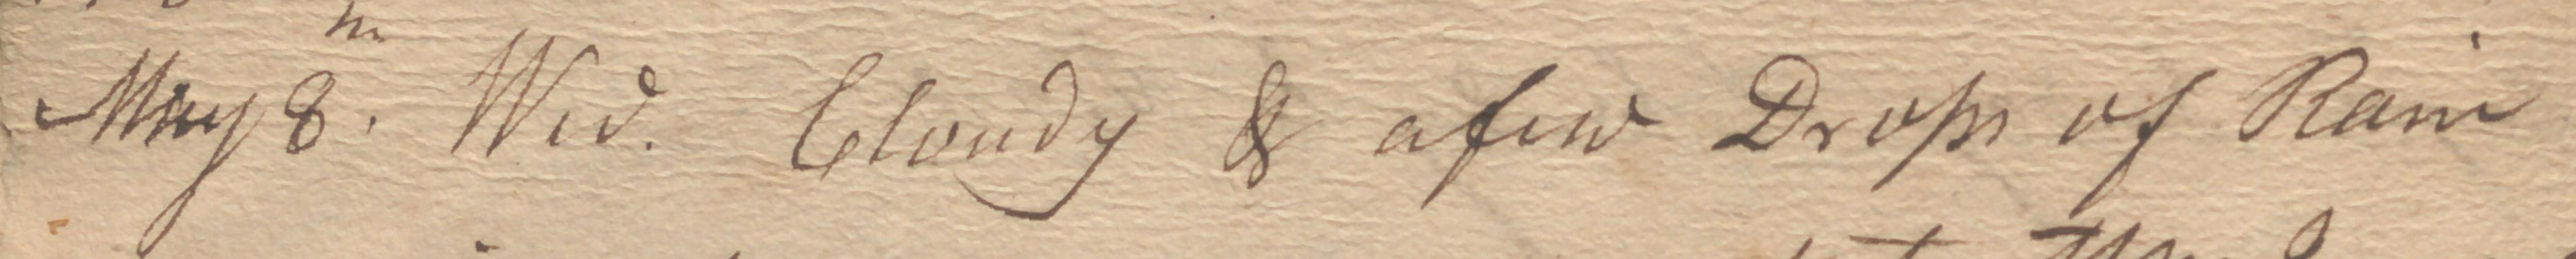May 8^th. Wed. Cloudy & a few Drops of Rain
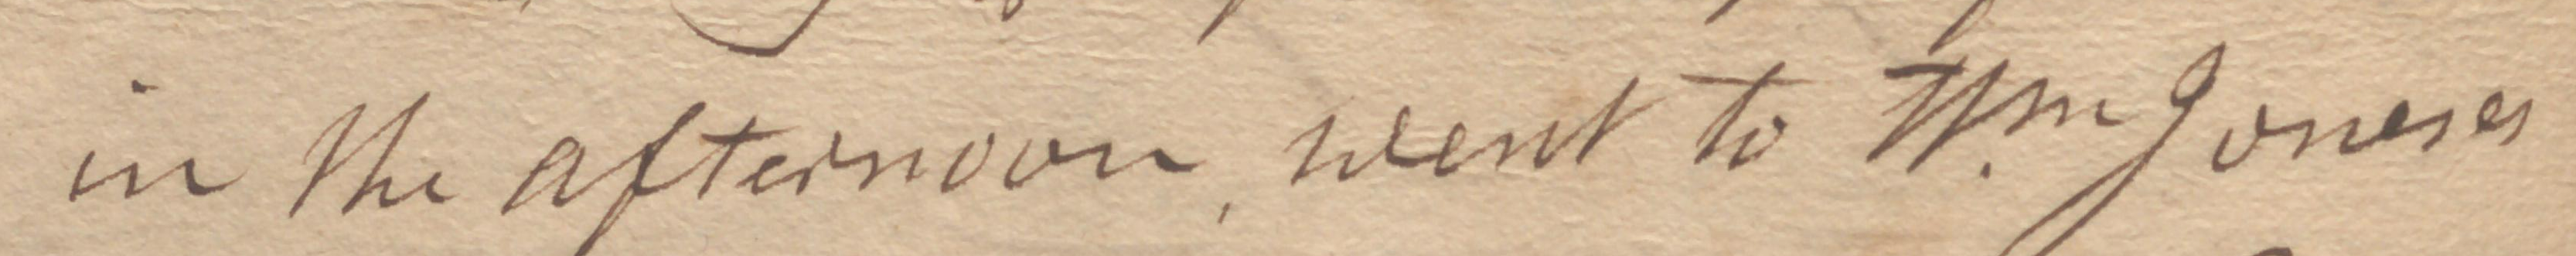in the afternoon went to W^m. Joneses
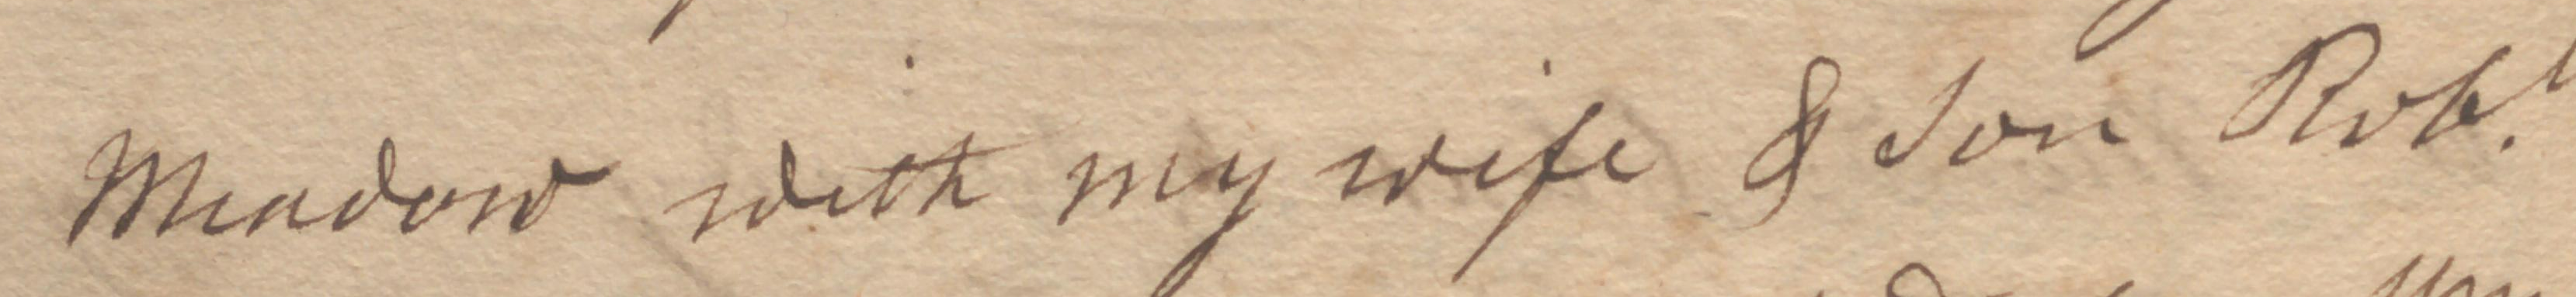Meadow with my wife & son Rob^t.
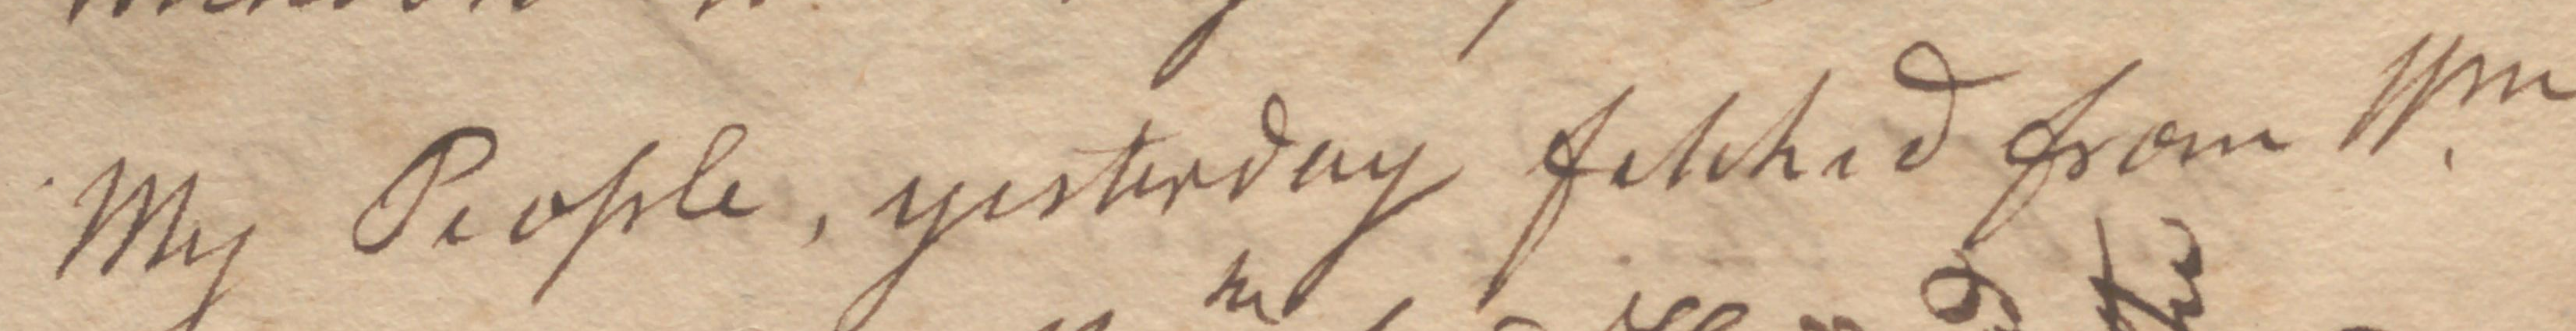My People, yesterday fetched from W^m.
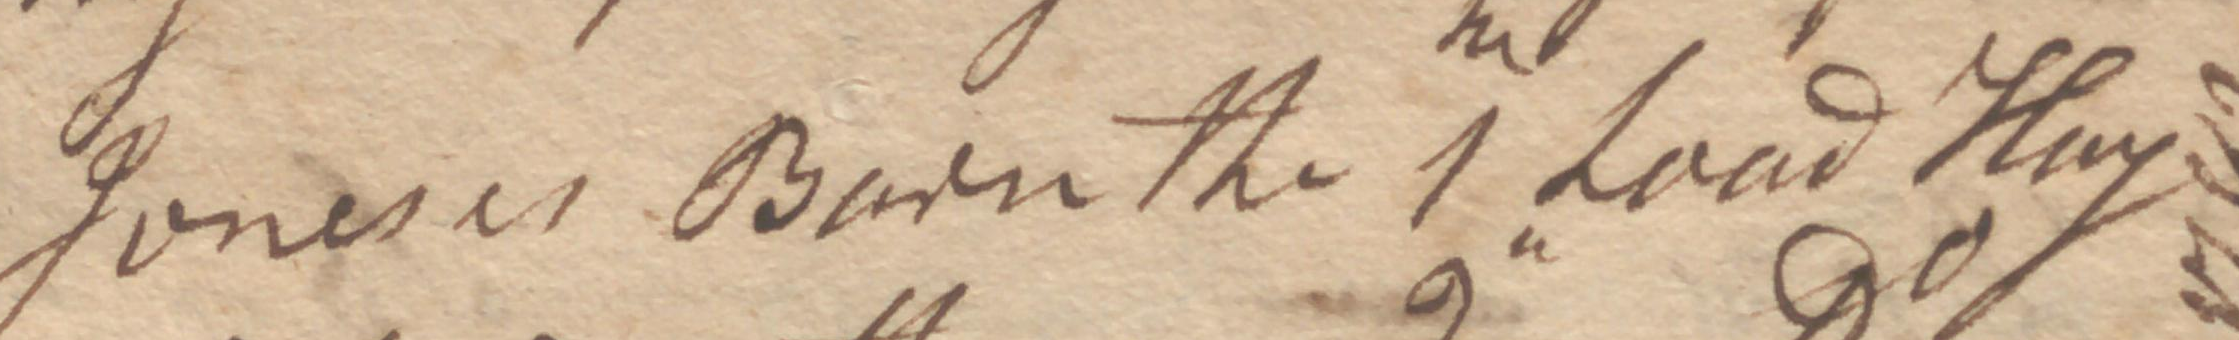Joneses Barn the 1^th Load Hay
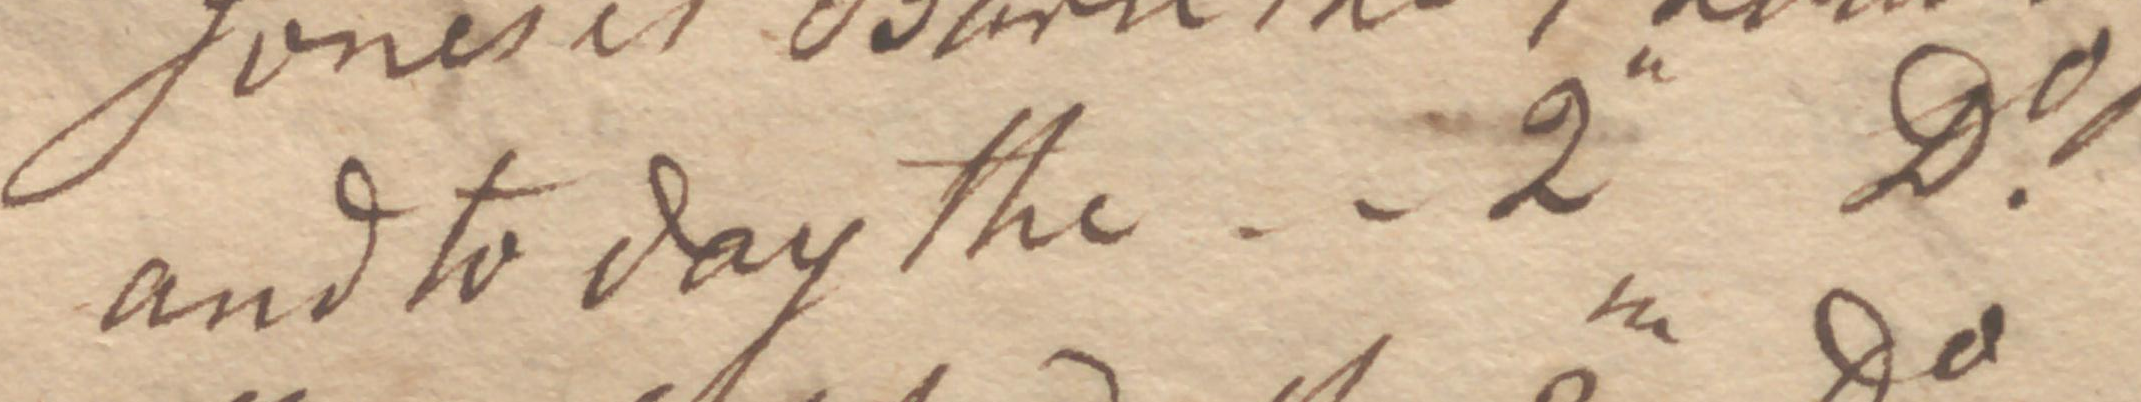and to day the 2^h D^o.
